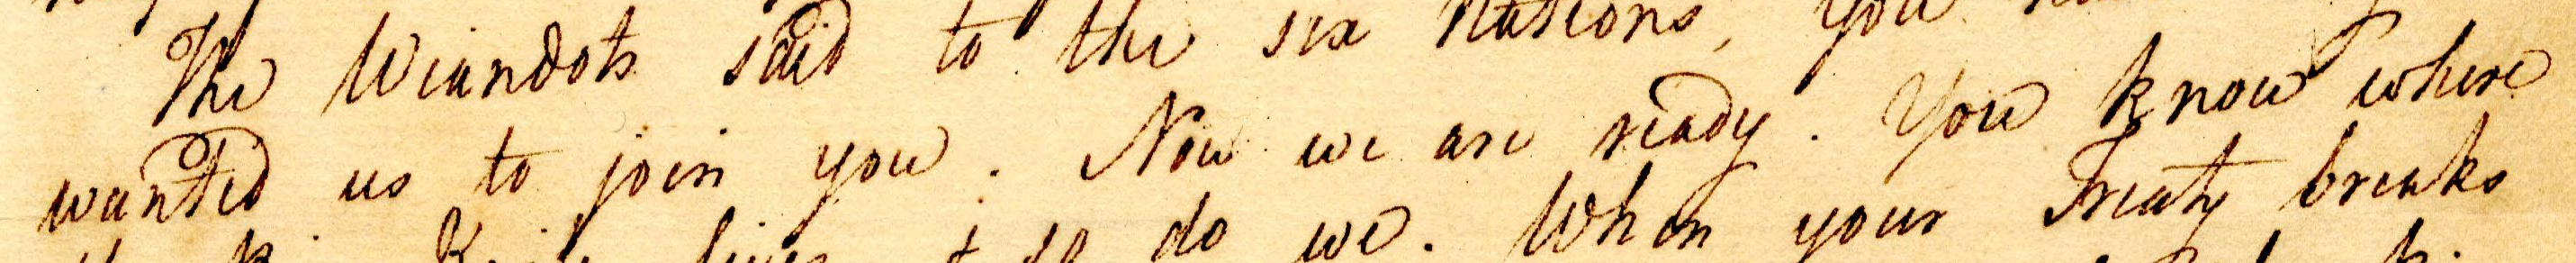wanted us to join you. Now we are ready. You know where
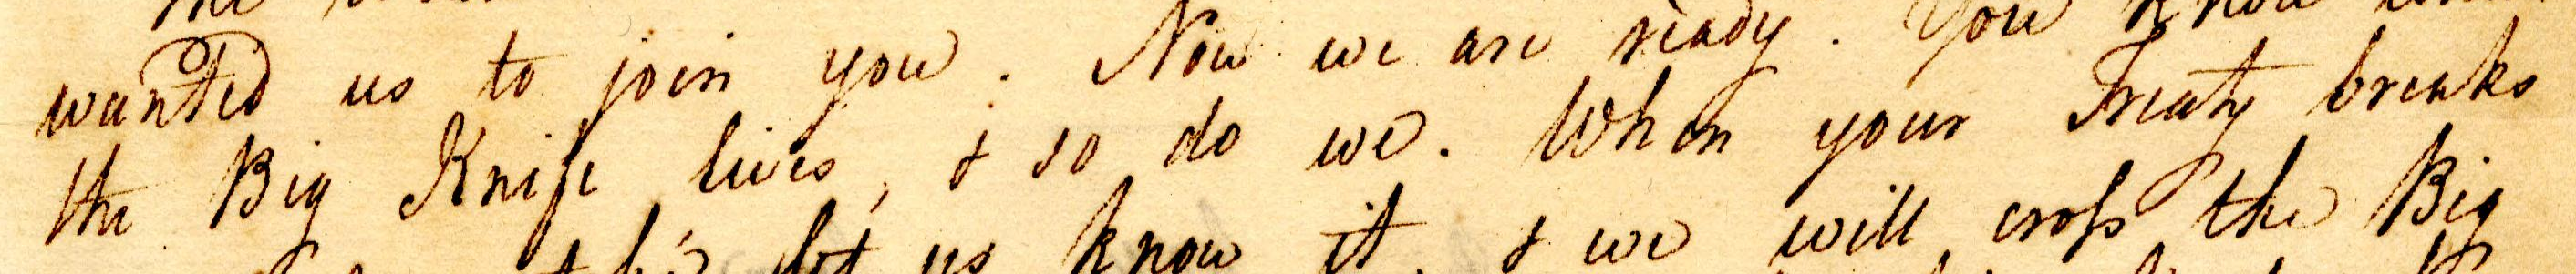the Big Knife lives, & so do we. When your Treaty breaks
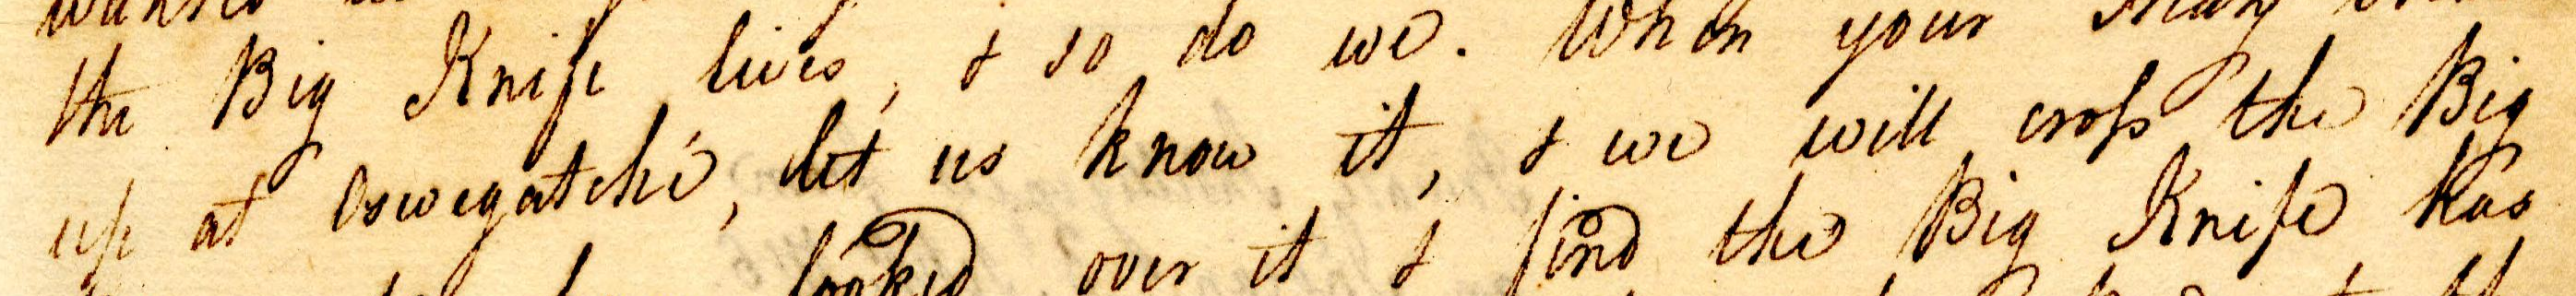up at Oswegatché, let us know it, & we will cross the Big
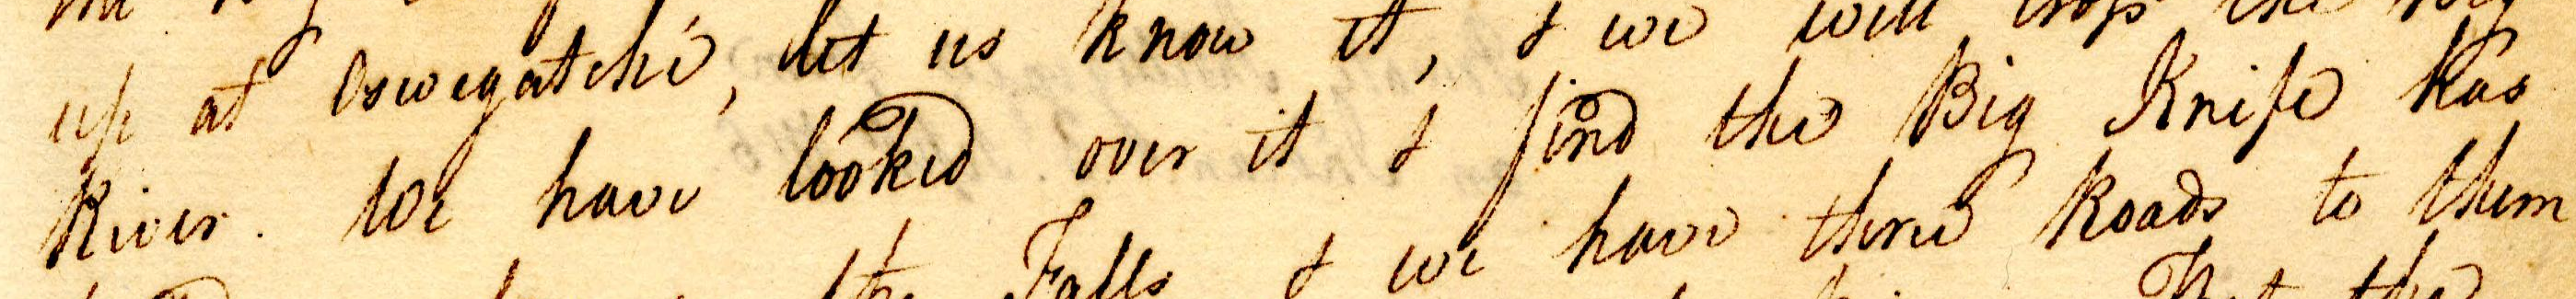River. We have looked over it & find the Big Knife has
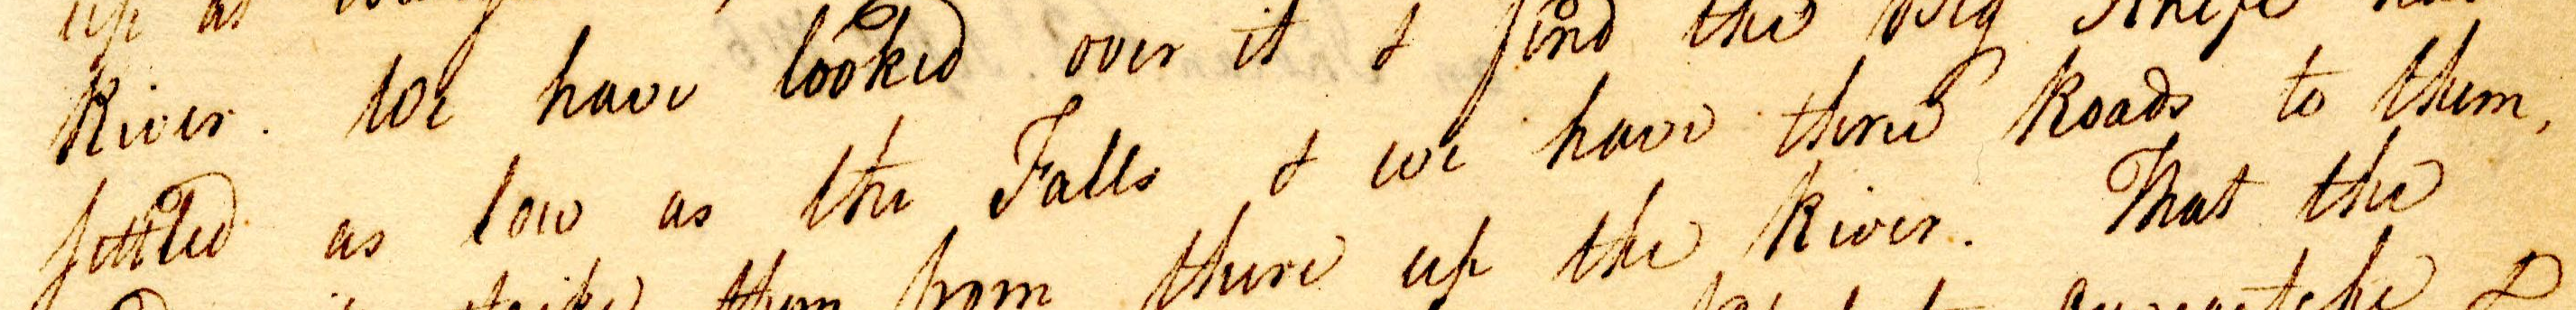settled as low as the Falls & we have three Roads to them,
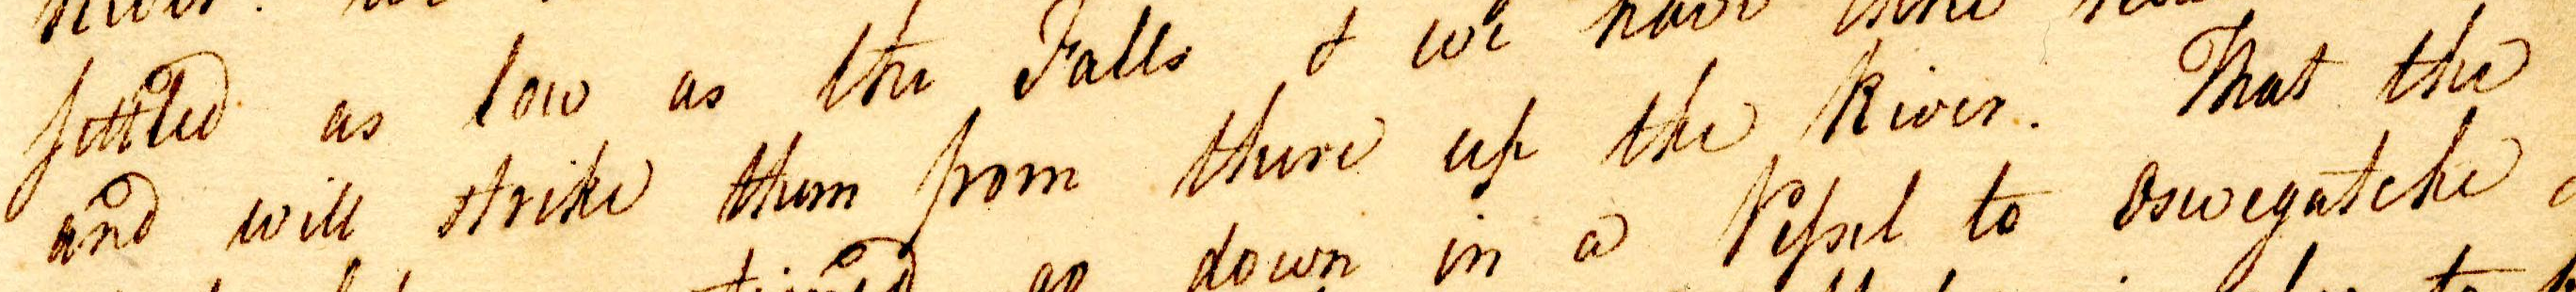and will strike them from there up the River. That the
